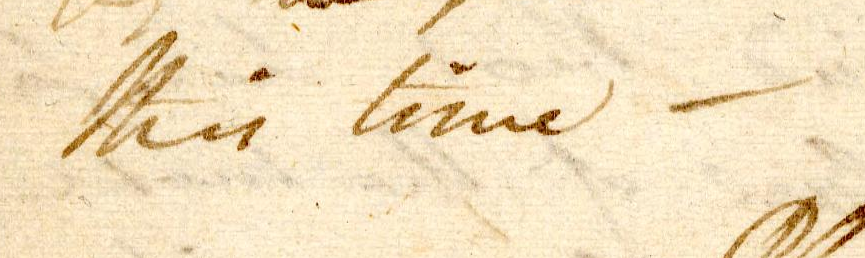this time.
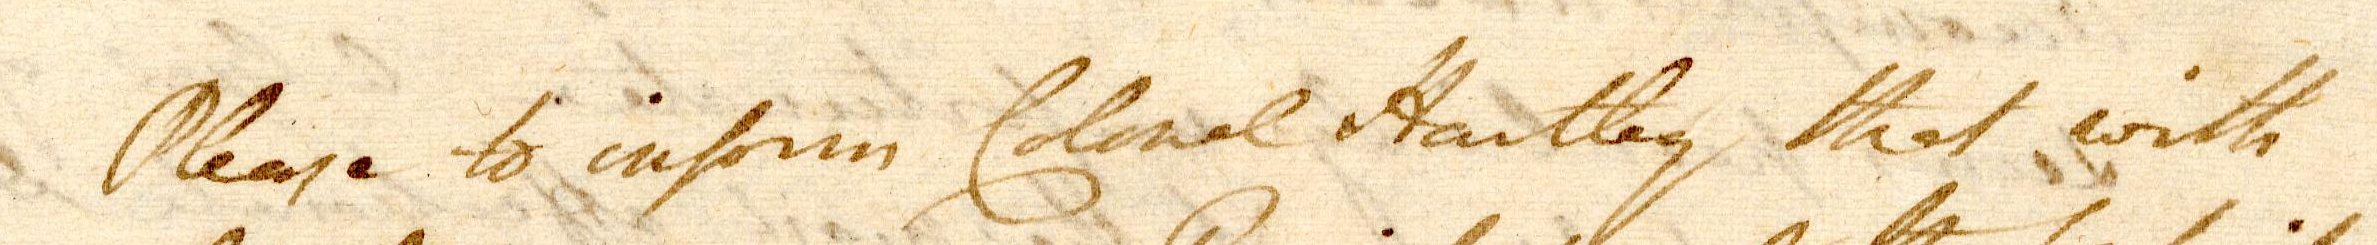Please to inform Colonel Hartley that with
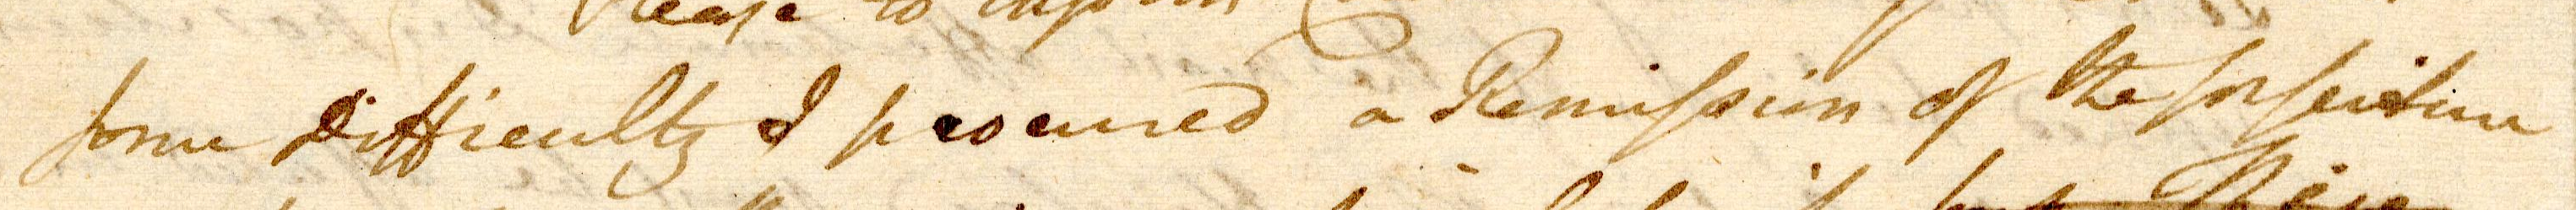some difficulty I procured a Penission of the forfeiture
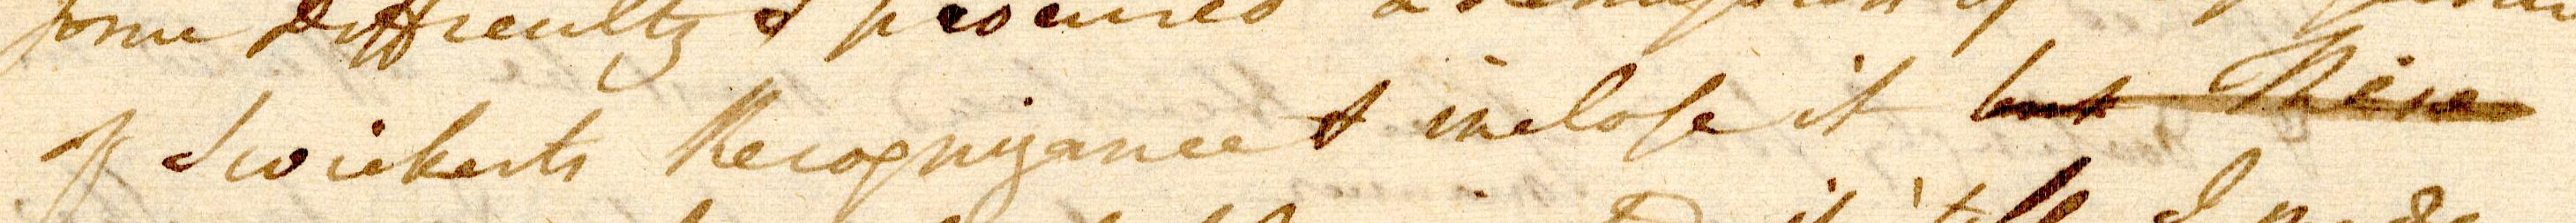of Swickerts Recognizance & inclose it but There
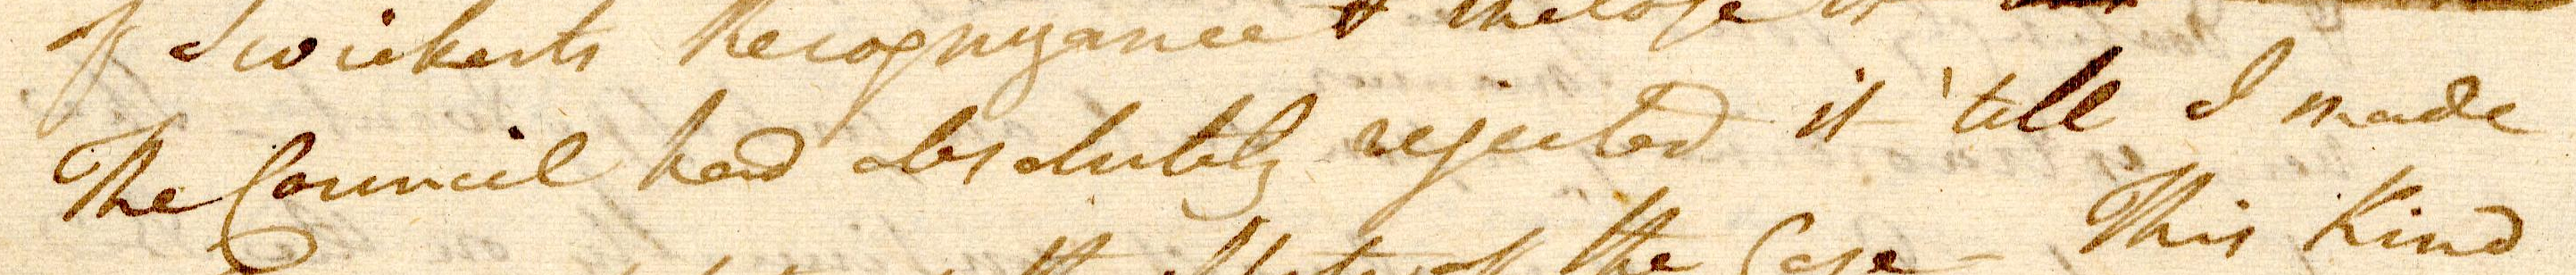The Council had absolutely rejected it 'till I made
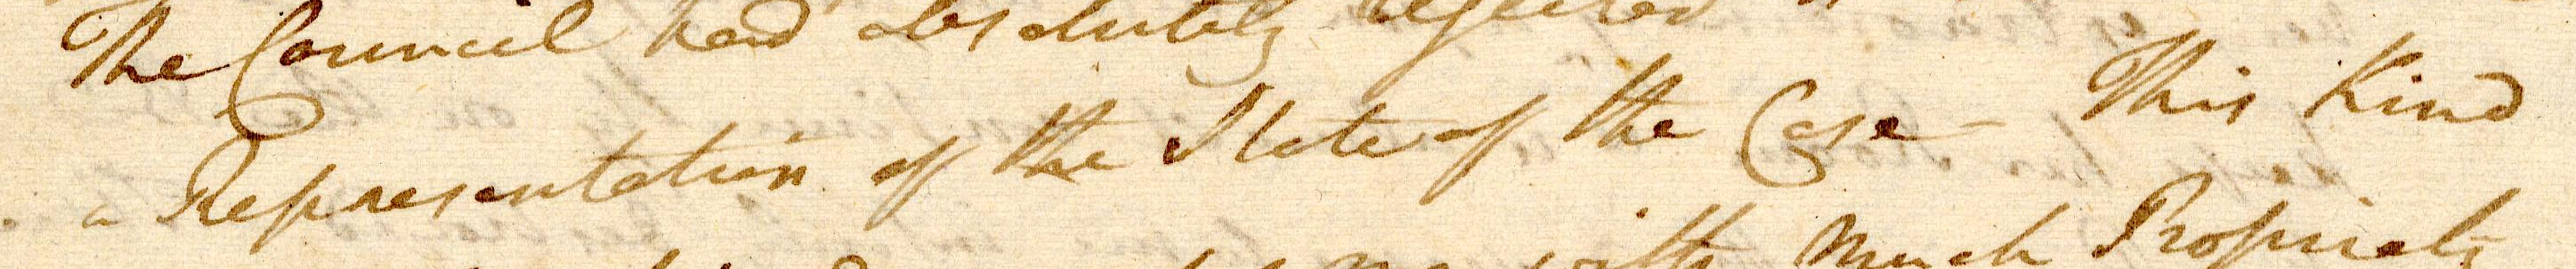a Representation of the State of the Case. This Kind
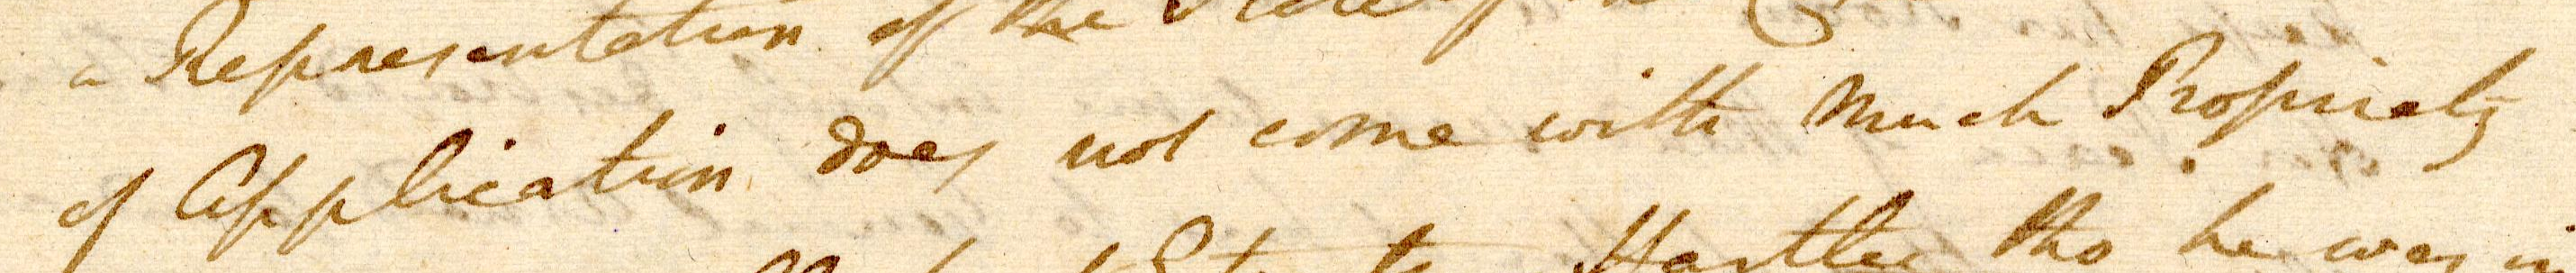of Application does not come with much Propriety
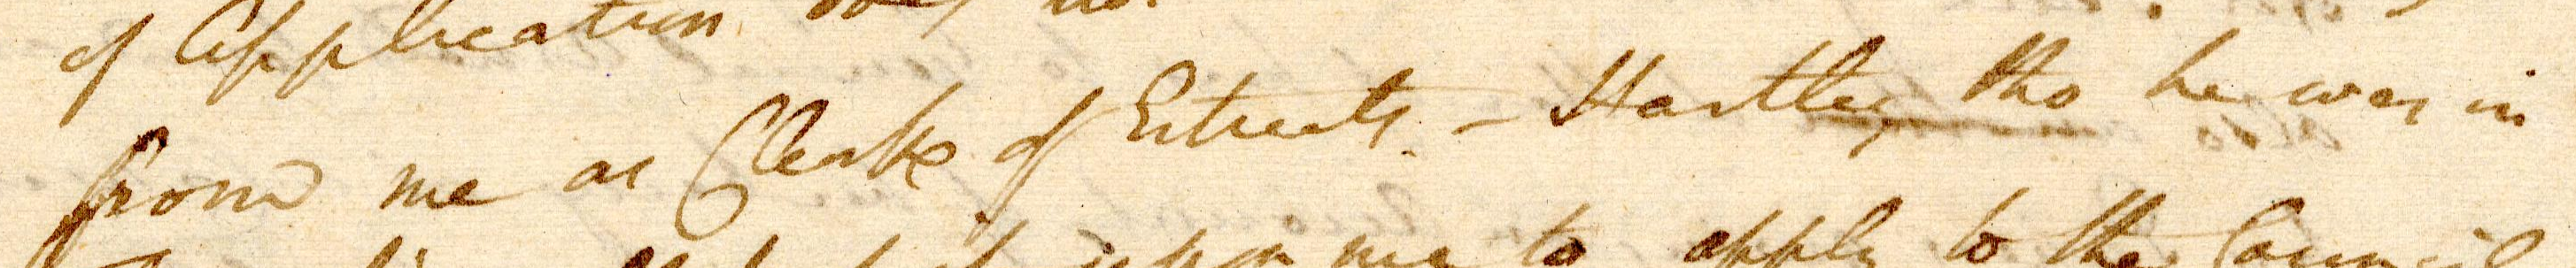from me as Clerk of Entreats. Hartley tho he was in
